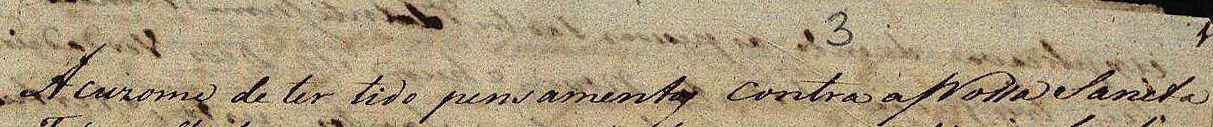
Acuzome de ter tido pensamentos contra a Nossa Sancta
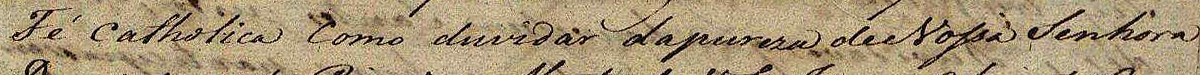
Fé catholica como duvidar da pureza de Nossa Senhora
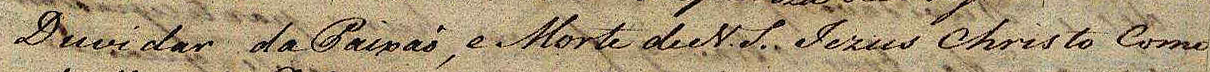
Duvidar da Paixaõ, e Morte de N. S. Iezus Christo Como
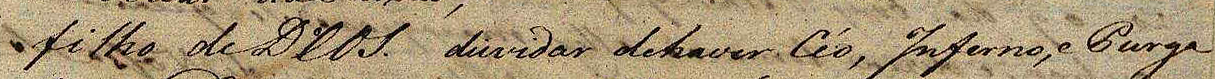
filho de DEOS. duvidar de haver Céo, Jnferno, e Purga
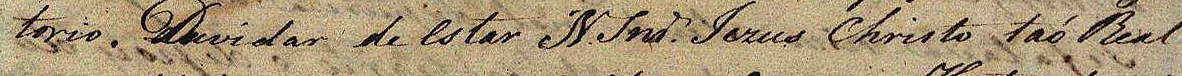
torio. Duvidar de estar N Snr̄. Iezus Christo taõ Real
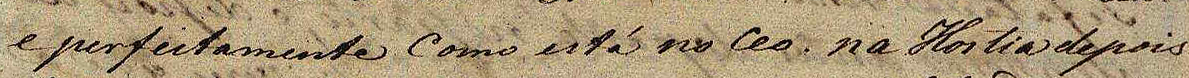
e perfeitamente como está no ceo. na Hostia depois
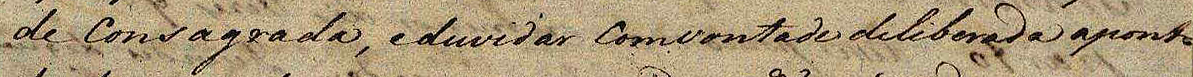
de consagrada, e duvidar com vontade deliberada a ponto
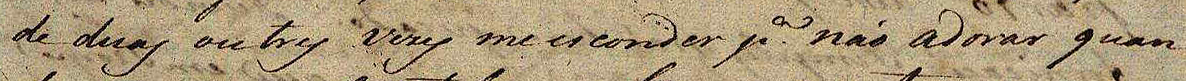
de duas ou tres vezes me esconder p.a naõ adorar quan
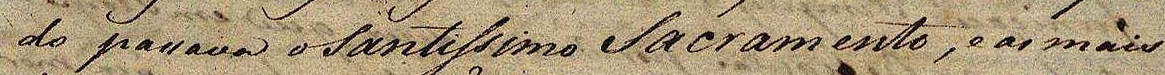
do passava o Santissimo Sacramento, e as mais
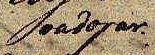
o adorar
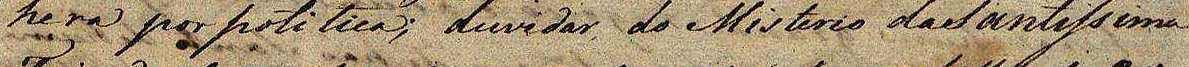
hera por potitica; duvidar do Misterio da Santissima
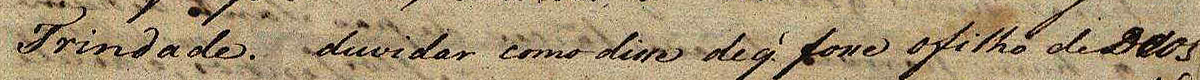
Trindade. duvidar como disse de q̄ fosse o filho de Deos
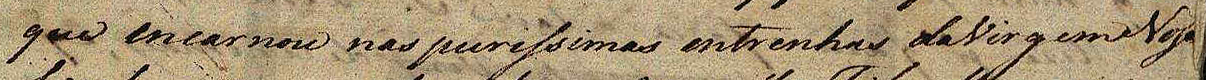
que encarnou nas purissimas entrenhas da Virgem Nosa
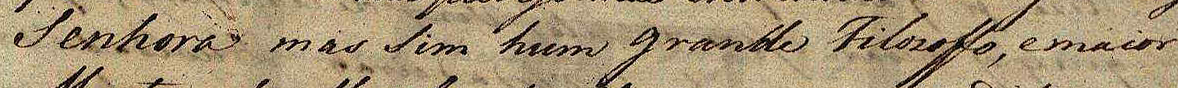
Senhora mas sim hum grande Filozoffo, e maior
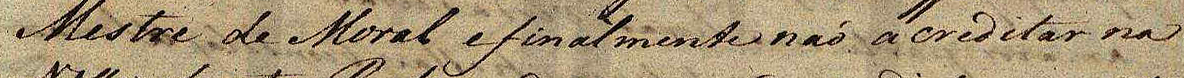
Mestre de Moral e finalmente naõ acreditar na
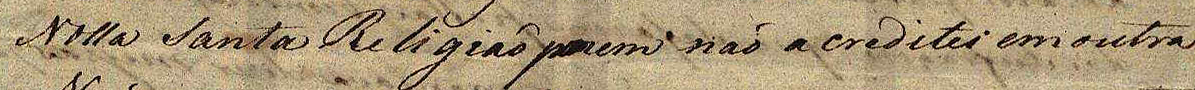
Nossa Santa Religiaõ porem naõ acreditei em outra
